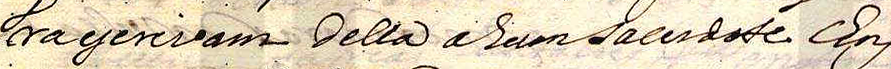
ra escrivam della a hum sacerdote chris
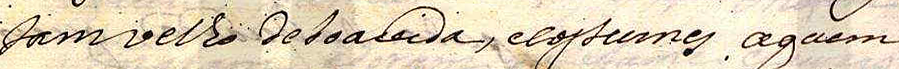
tam velho de boa vida, e costumes a quem
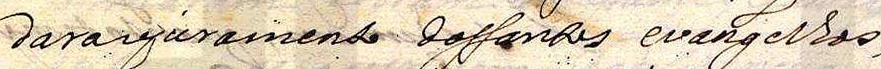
dara o juramento dos santos evangelhos,
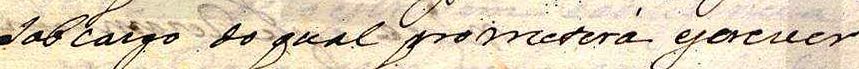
sob cargo do qual prometerá escreuer
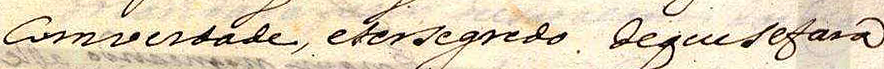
com verdade, e ter segredo de que se fara
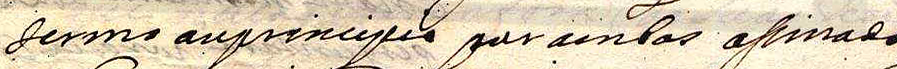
termo ao principio por ambos assinado,
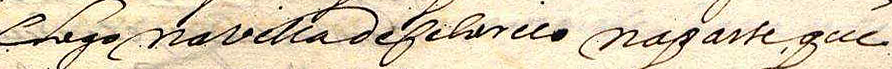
e Logo na villa de Celorico na parte, que
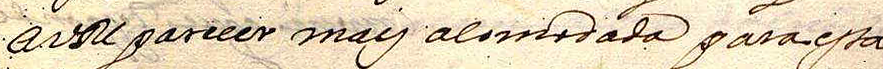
a VM parecer mais acomodada para esta
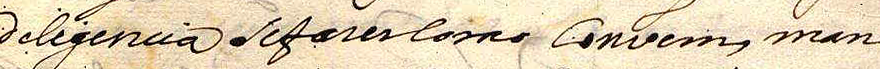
deligencia se fazer como convem, man
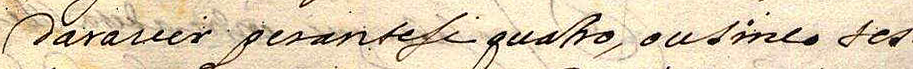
dara vir perante si quatro, ou sinco tes
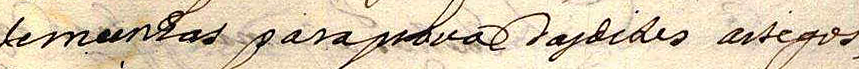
temunhas para prova dos ditos artigos,
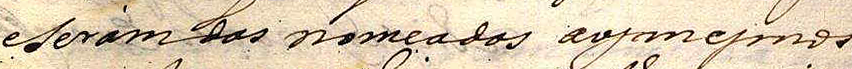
e seram das nomeadas aos mesmos
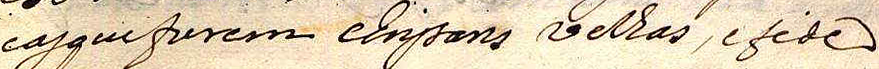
e as que forem christans velhas, e fide
